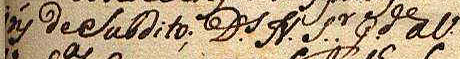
in̄s de Subdito; D.s N. S.r G.de a V.
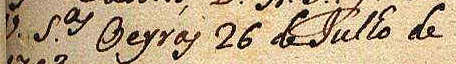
V. S.as Oeyras 26 de Iulho de
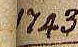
1743
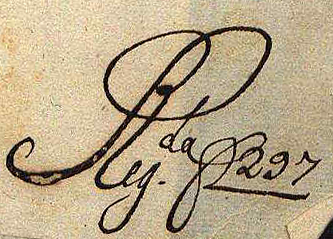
Reg.da fl 297
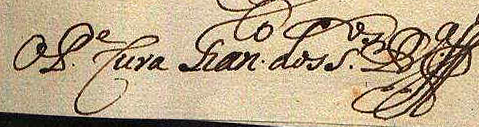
O P.e Cura Fran.Co dos S.tos Pr.a
